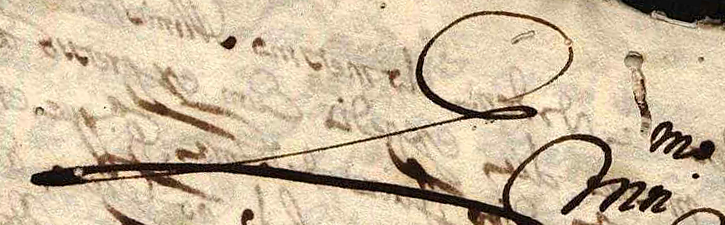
Emnmo.
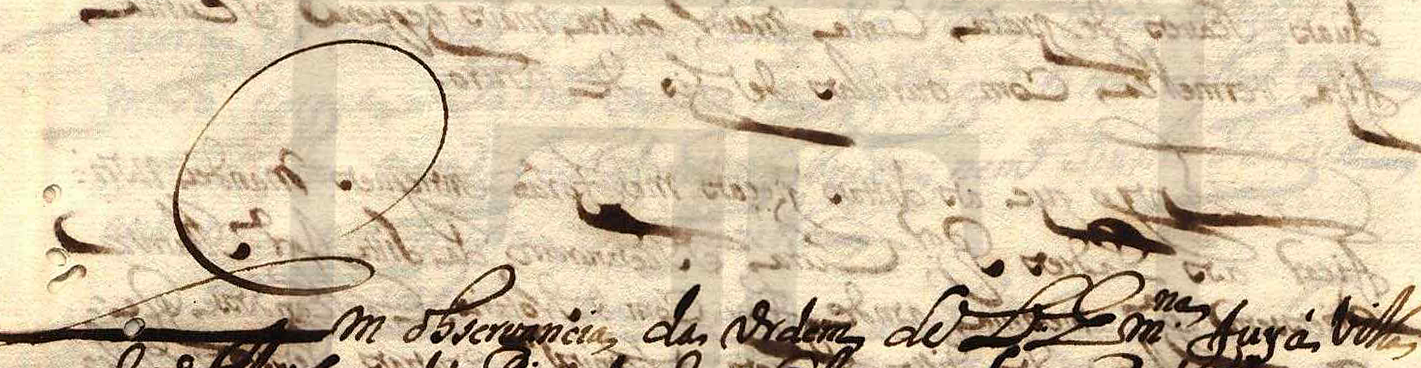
Em obseruancia, da Ordem de V EM.na fuy á Villa
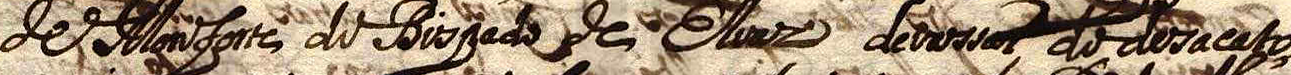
de Monforte do Bispado de Elvaz devassar do desacato
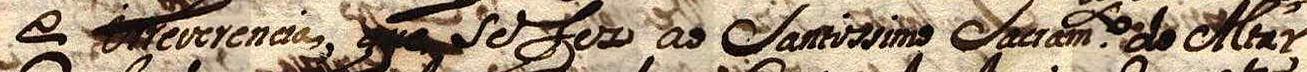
e irreverencia, que se fez ao Santissimo Sacram.to do Altar
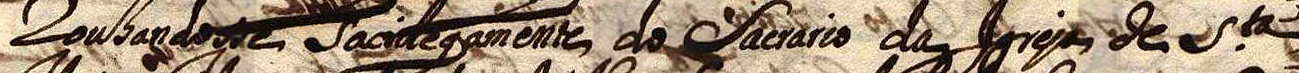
Roubandosse Sacrilegamente do Sacrario da Igreja de S.ta
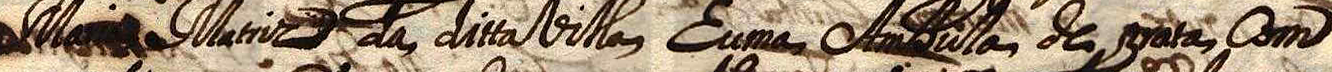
Maria Matriz da ditta Villa huma Ambula de prata Com
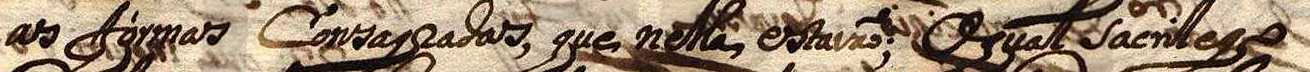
as fórmas Consagradas, que nella estavão; O qual sacrilego
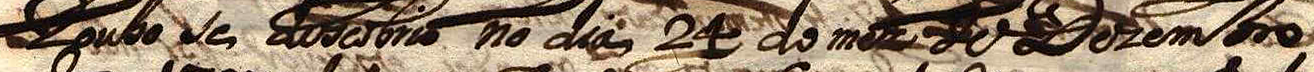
Roubo se descobrio no dia 24 do mez de Dezembro
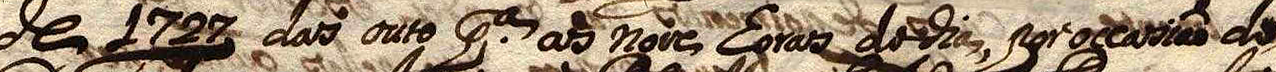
de 1727 das outo p.a as nove horas do dia, por occasião do
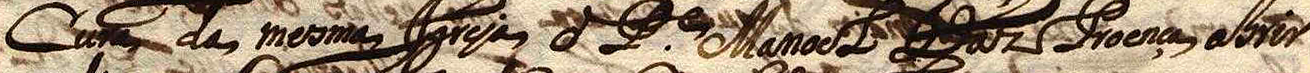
Cura da mesma Jgreja o P.e Manoel Vaz Proença abrir
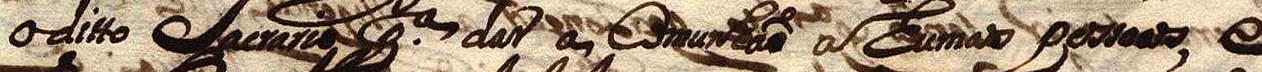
o ditto Sacrario p.a dar a Comunhão a humas pessoas, e
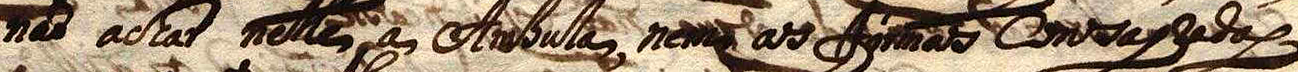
não achar nelle a Ambula, nem as fórmas consagradas
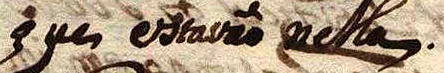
que estavão nella.
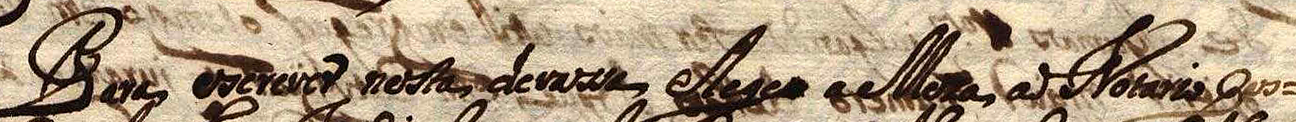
Para o escrever nesta devassa elegeo a Meza ao Notario gas
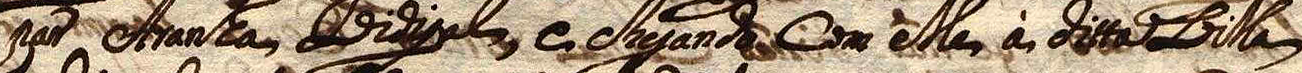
par Aranha Vidigal, e chegando Com ella á ditta Villa
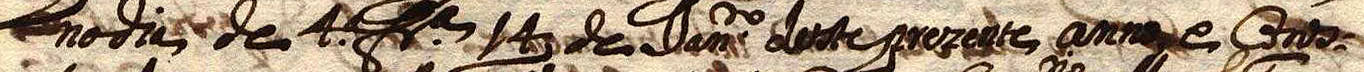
no dia de 4.a fr.a 14 de Ian.ro deste prezente anno e Cons
